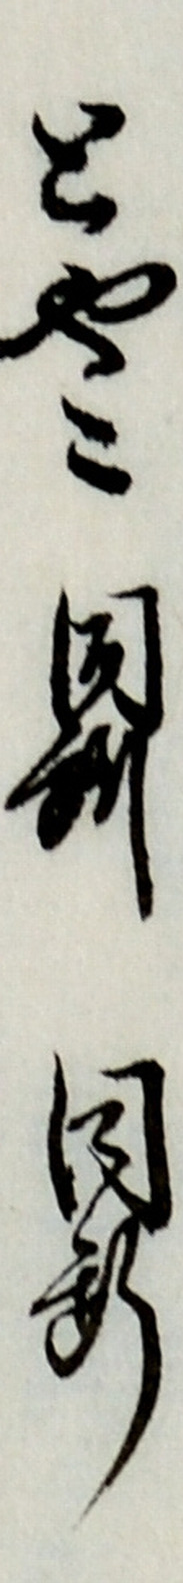とやこ同所同断
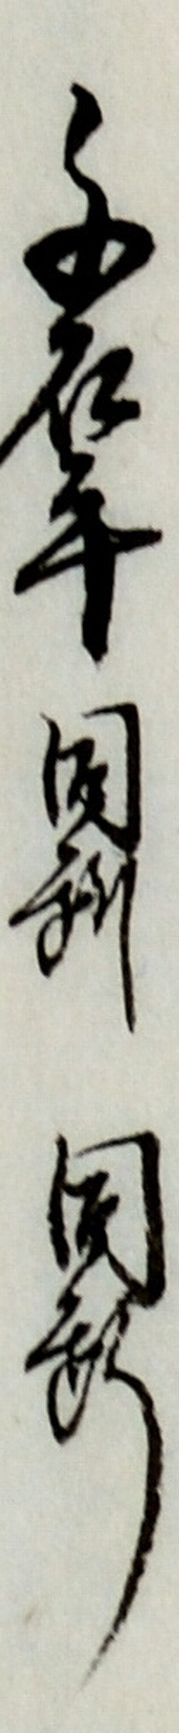千石平同所同断

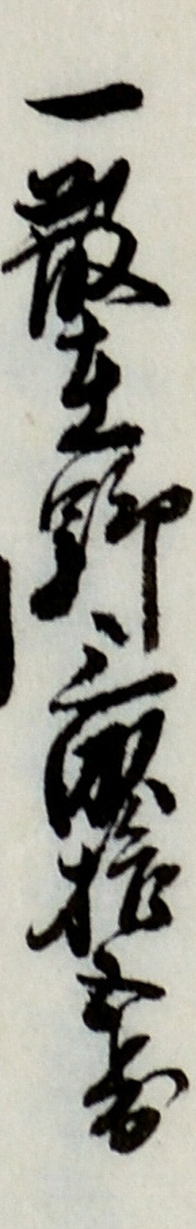一散在野三畝拾五歩

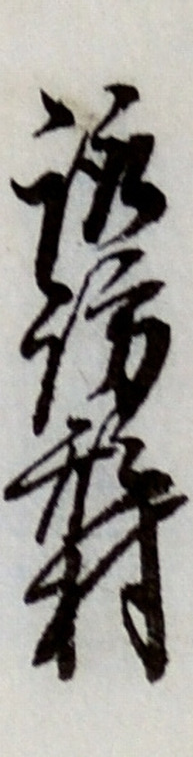諏訪形村
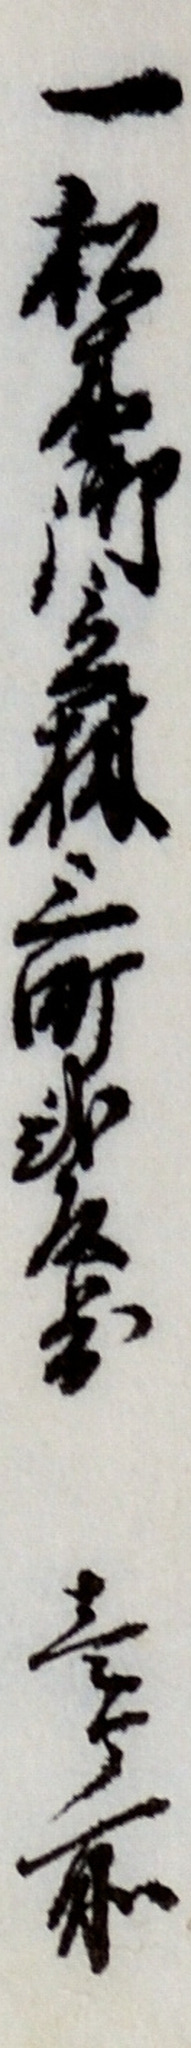一松木御立林三町弐反歩壱ケ所
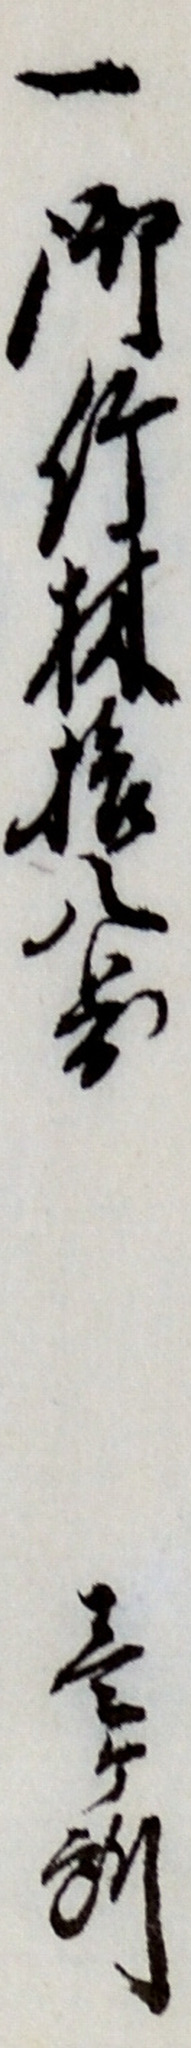一御竹林拾八歩壱ケ所
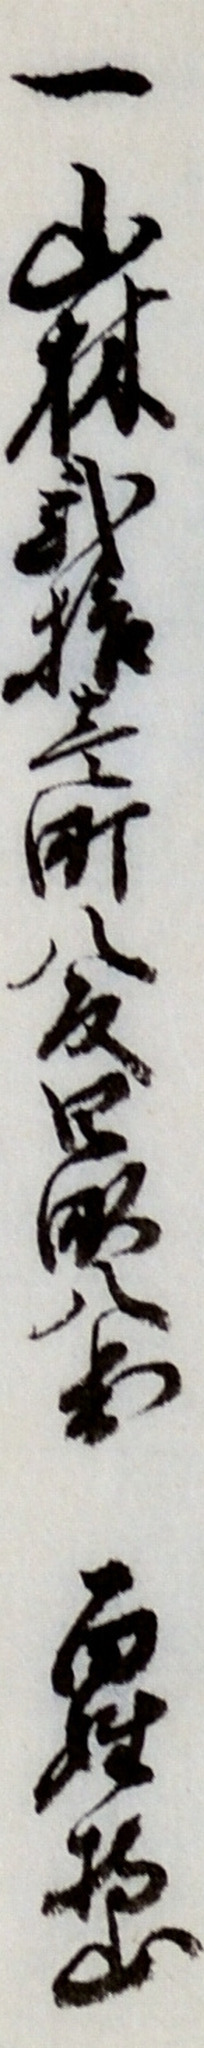一山林弐拾壱町八反四畝八歩百姓持山
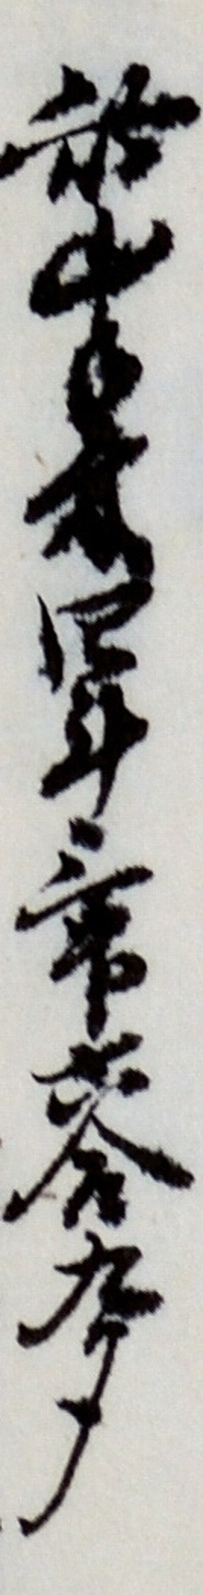此山手米四斗三升六合九勺
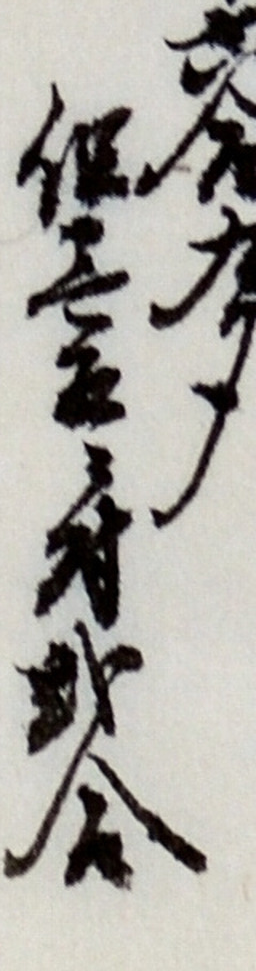但壱反ニ付弐合
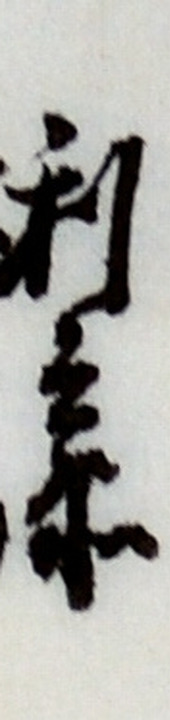利兵衛
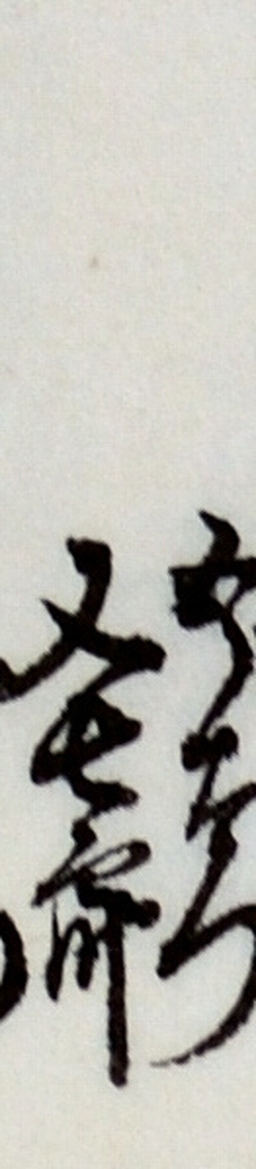又七郎
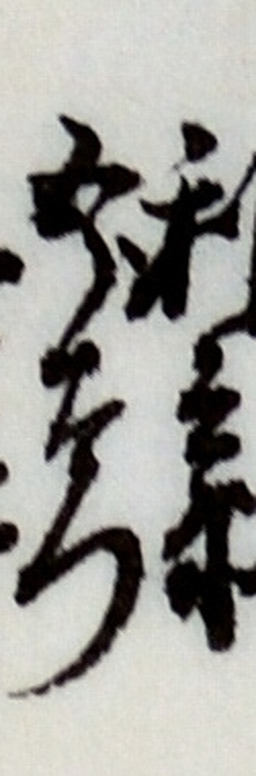五郎右衛門
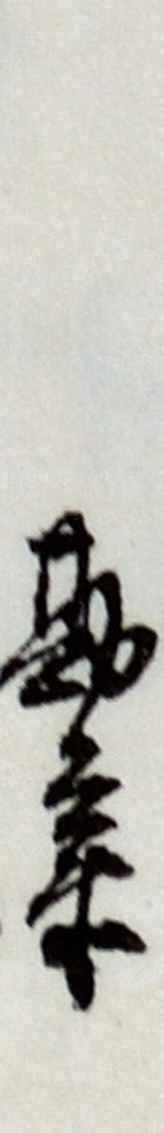利兵衛
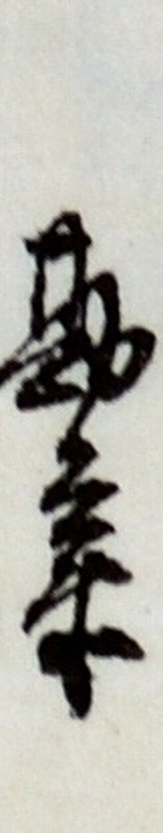利兵衛
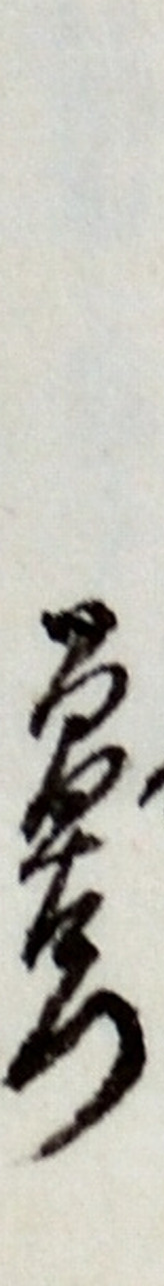曾右衛門
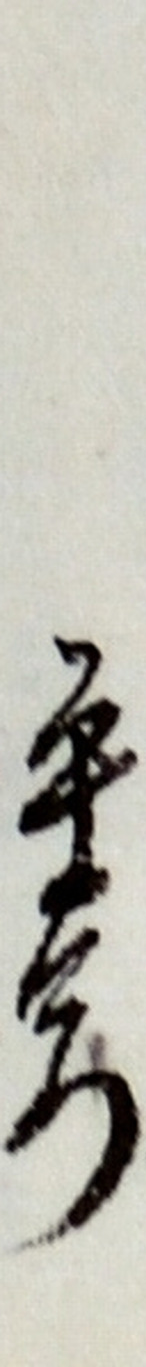平右衛門
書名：御領分中山林社地手控
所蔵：伊那市立高遠町図書館・合同会社AMANE
